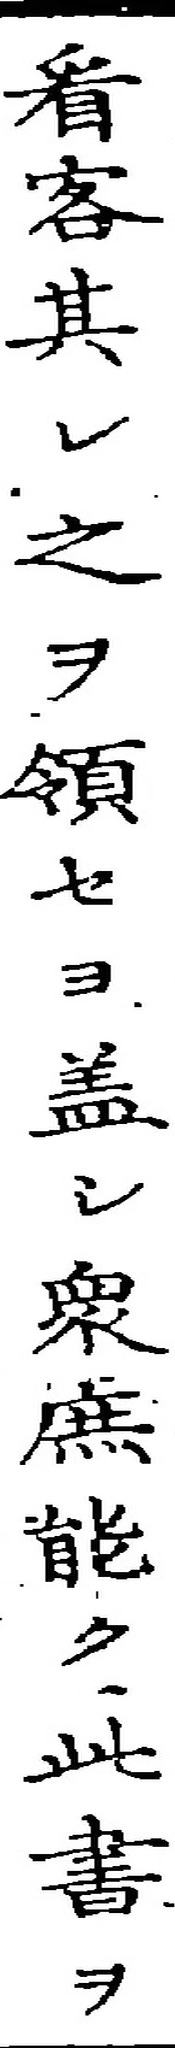看客其レ之ヲ領セヨ盖シ衆庶能ク此書ヲ
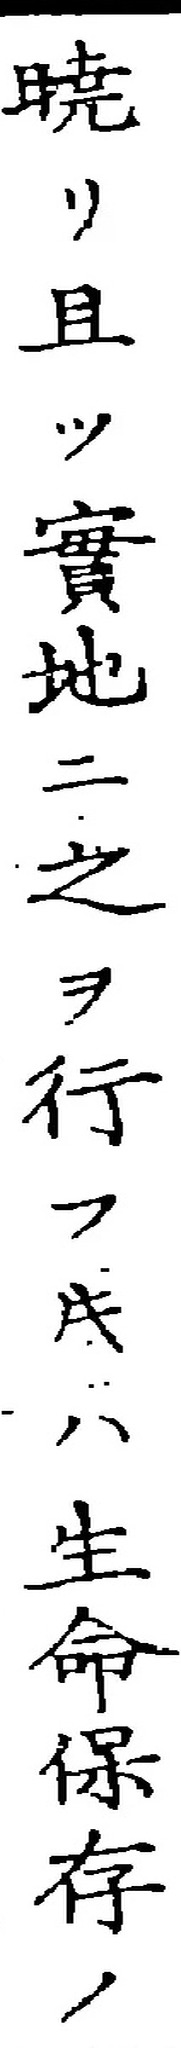暁リ且ツ實地ニ之ヲ行フトキハ生命保存ノ
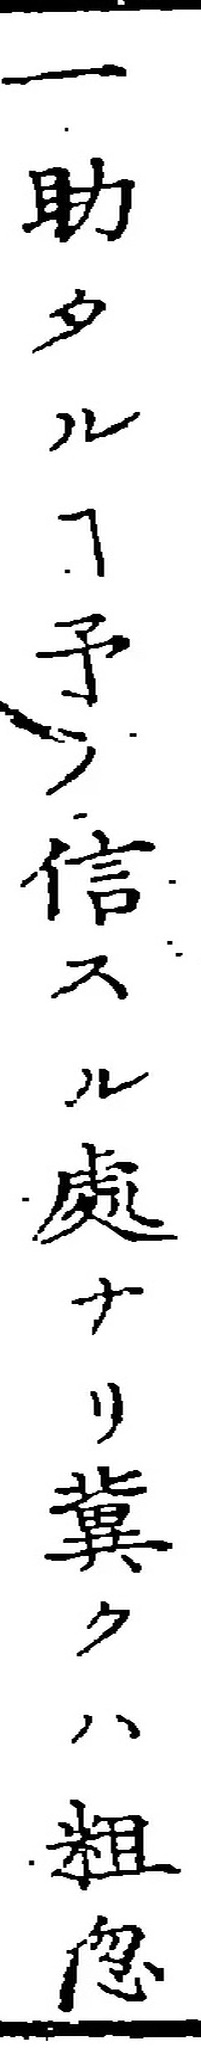一助タルヿ予ノ信スル處ナリ冀クハ粗忽
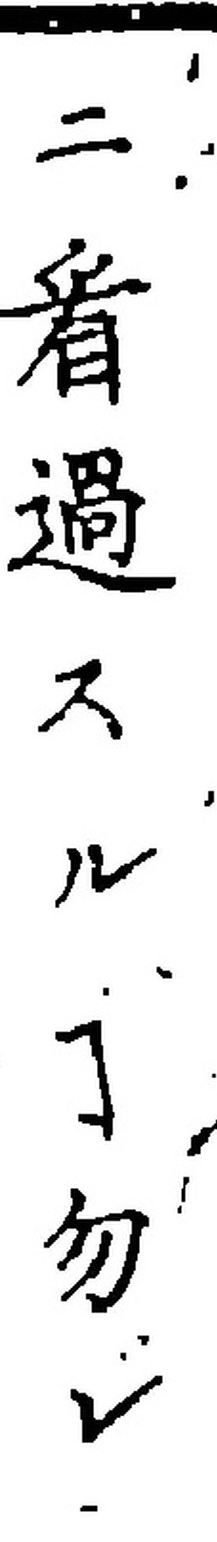ニ看過スルヿ勿レ
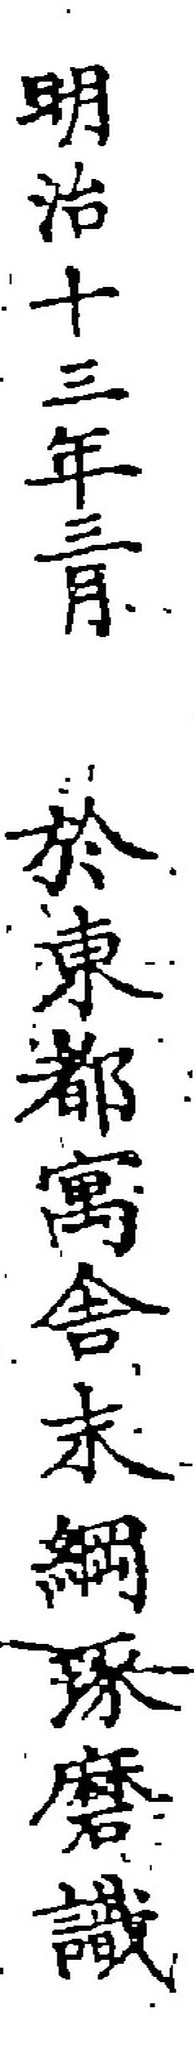明治十三年三月於東都寓舎末綱琢磨識
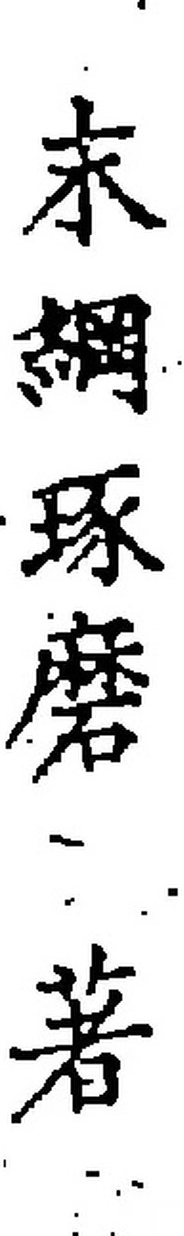末綱琢磨著
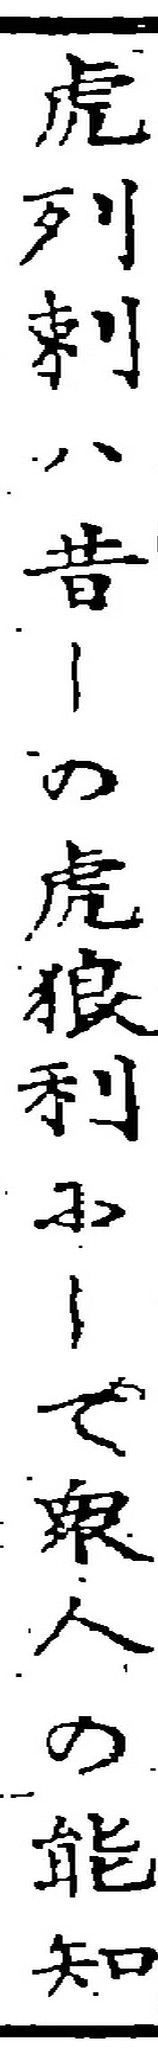虎列刺は昔しの虎狼利にして衆人の能知
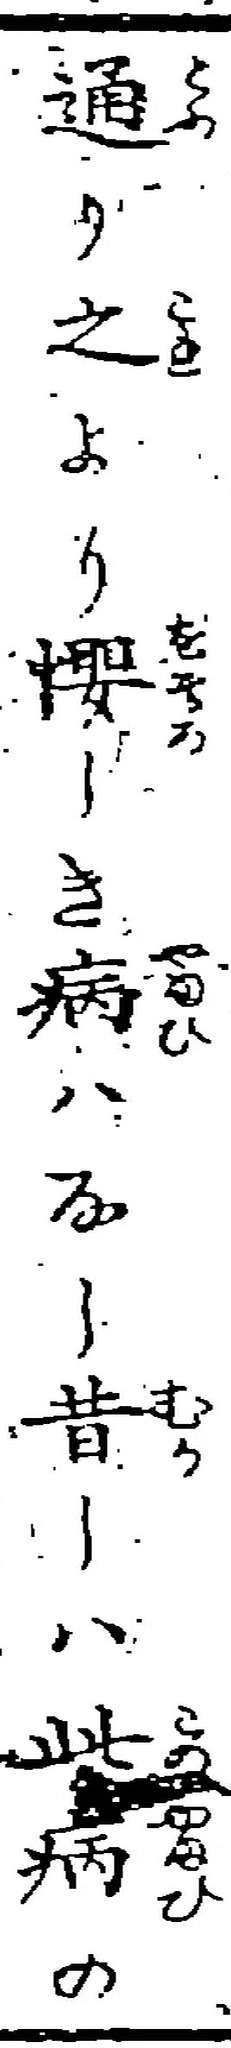通り之よりしき病はなし昔しは此病の
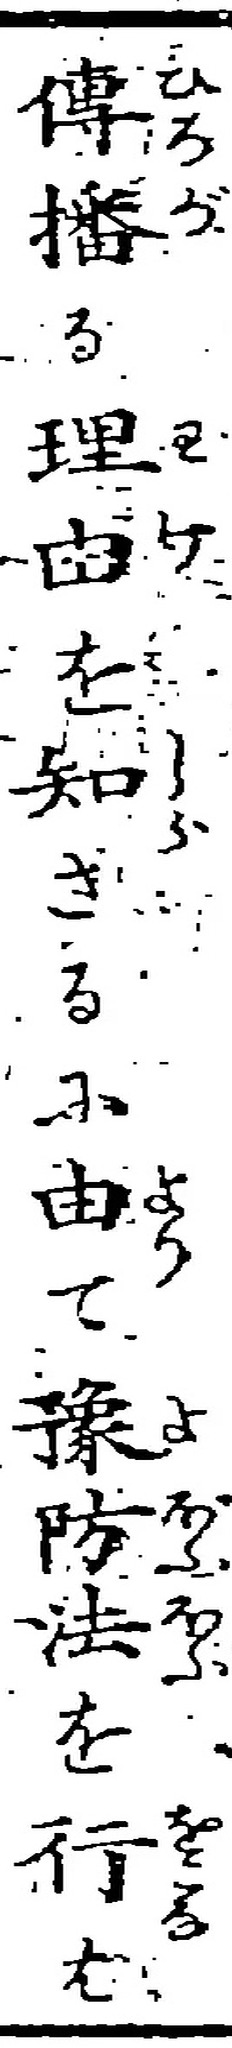伝播る理由を知さるに由て予防法を行は
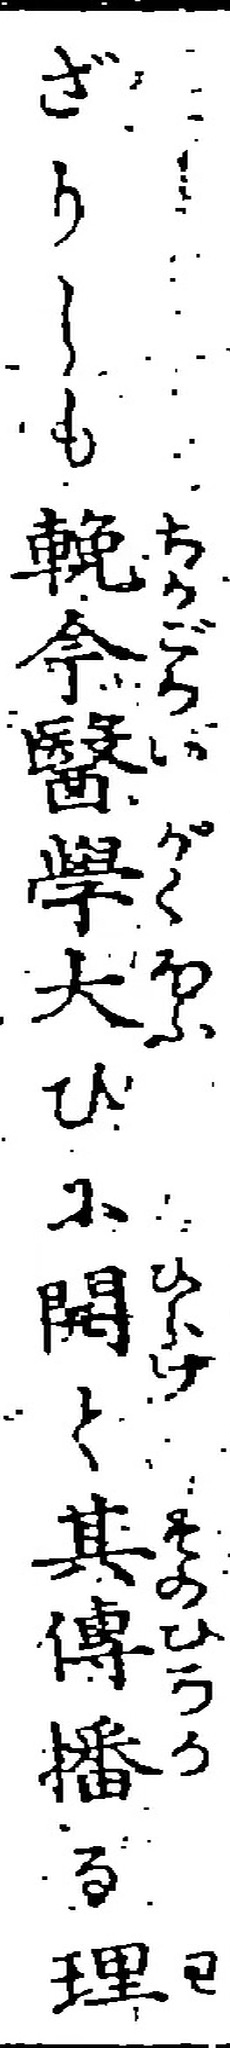ざりしも輓今医学大ひに開と其伝播る理
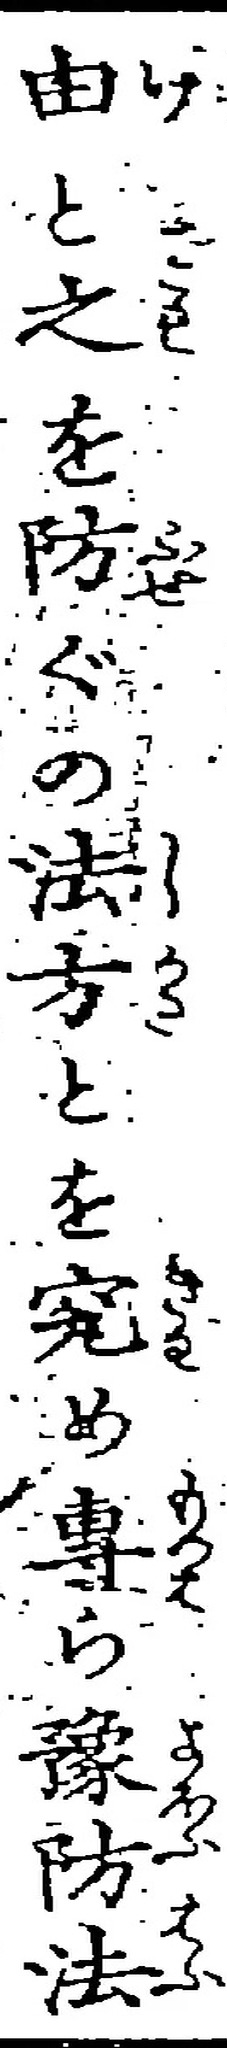由と之を防ぐの法方とを究め専ら予防法

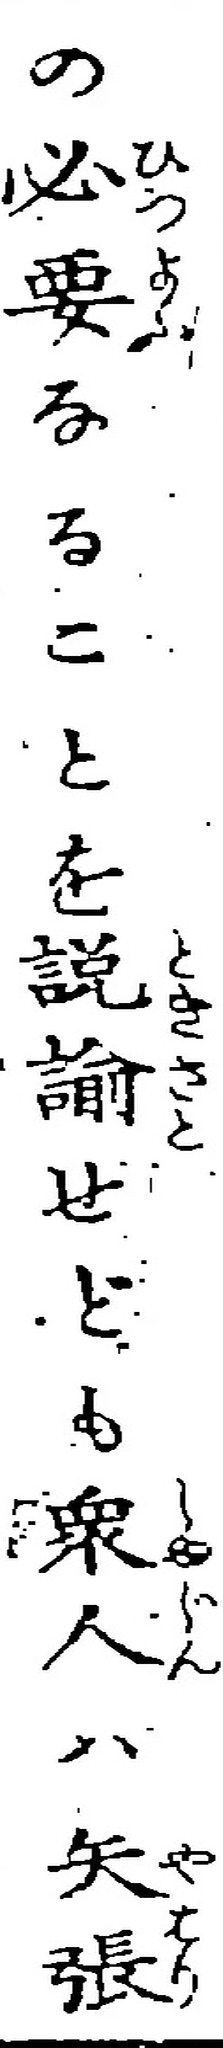の必要なることを説諭せども衆人は矢張
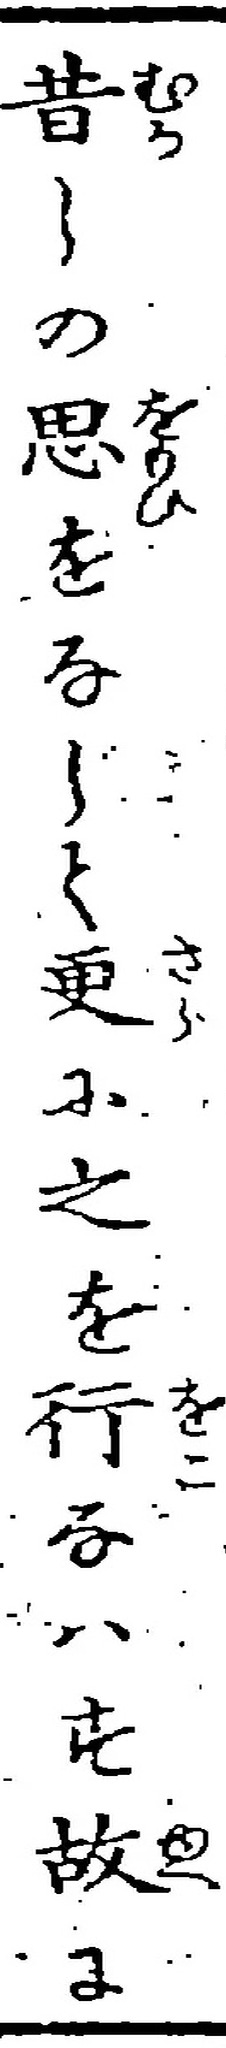昔しの思をなして更に之を行なはし故に
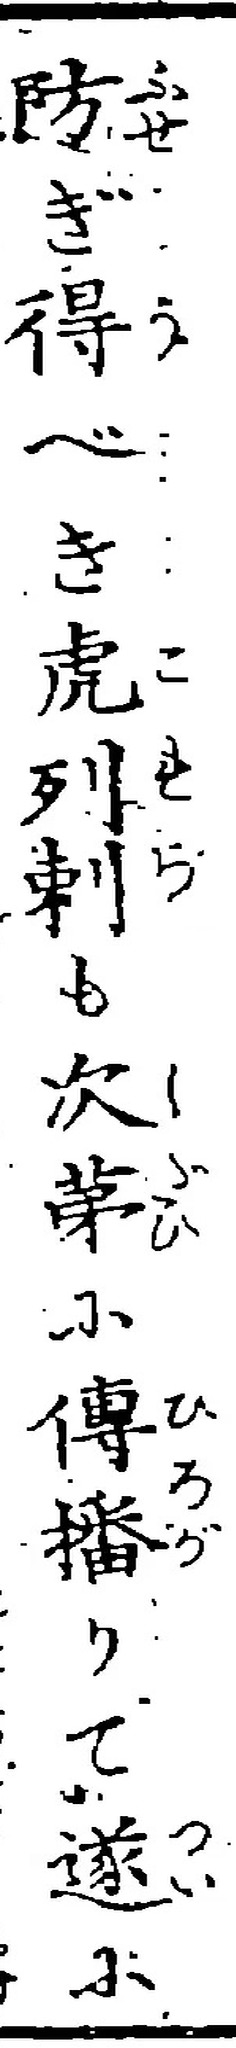防ぎ得べき虎列刺も次第に伝播りて遂に
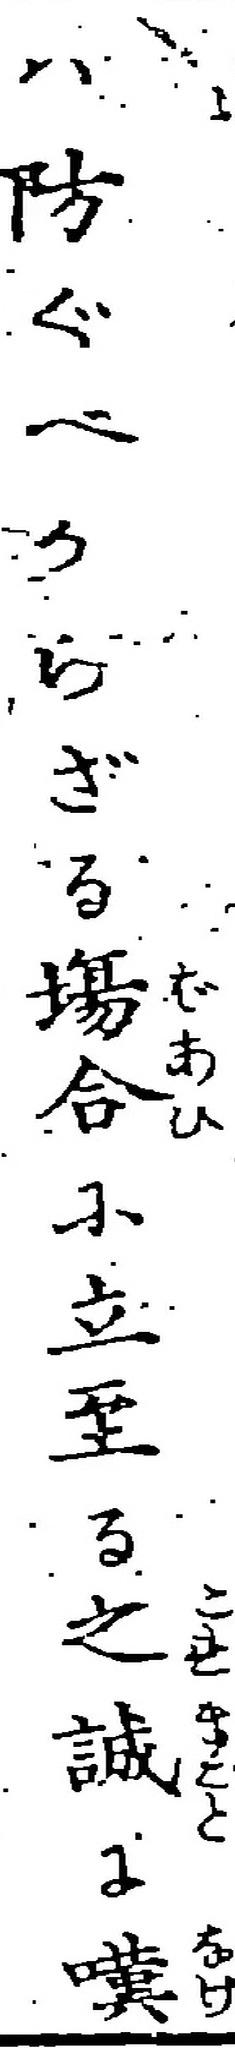は防ぐべからざる場合に立至る之誠に嘆
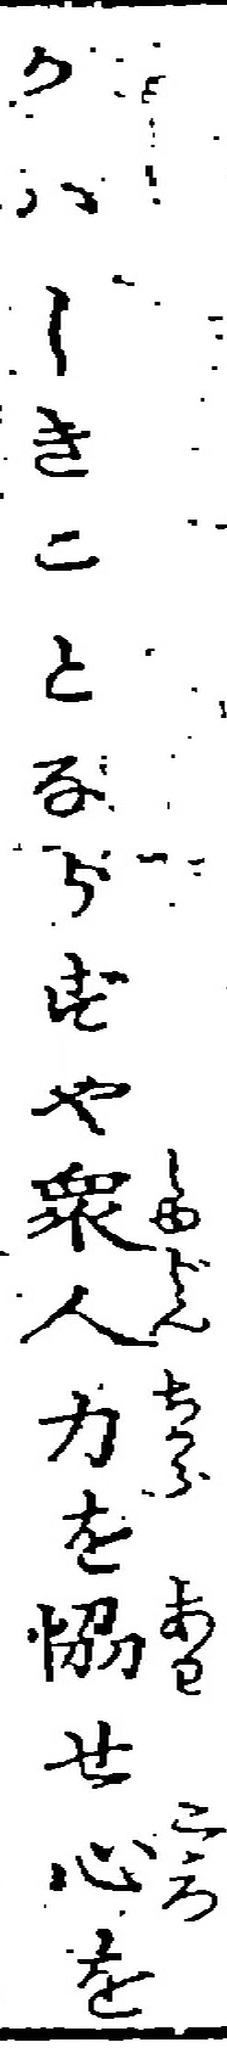かはしきことならずや衆人力を協せ心を
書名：コレラ予防命乃後見
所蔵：国立国会図書館 National Diet Library, JAPAN
